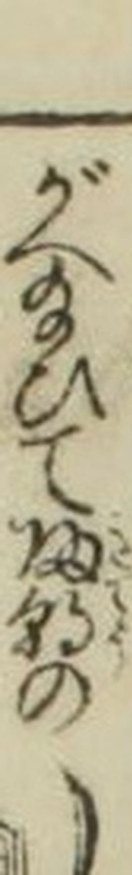がへ給ひて帰朝の
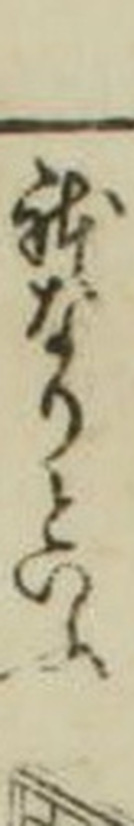躰なりといふ
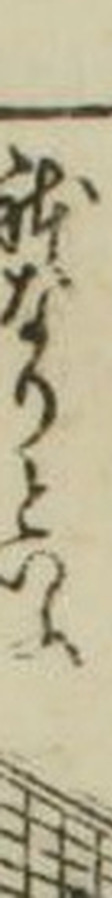躰なりといふ
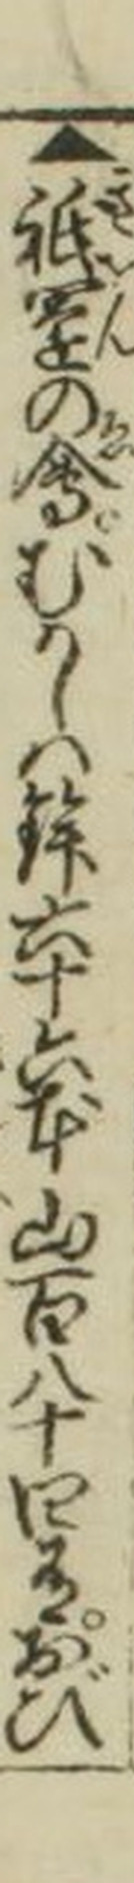▲祇園の会。むかしハ鉾六十六本山百八十四有。おび
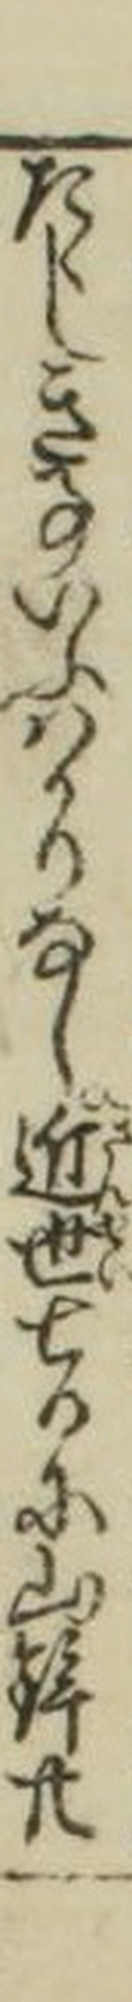たゝしき事いふハかりなし。近世七日に山鉾共
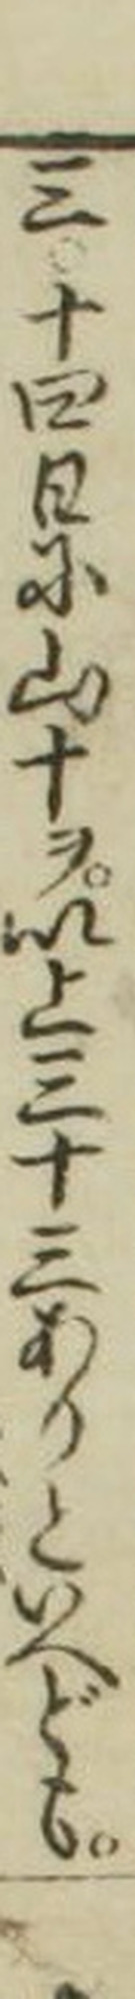三。十四日に山十ヲ。以上三十三ありといへども。
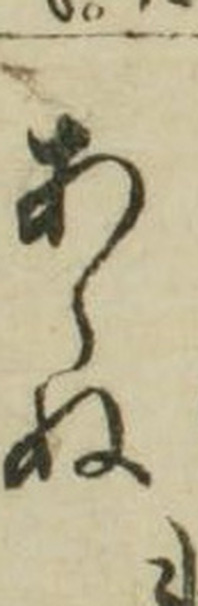あらぬ
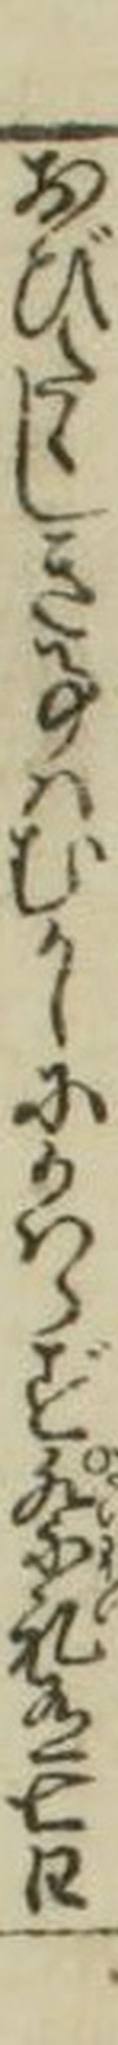おびたゝしき事ハむかしにかハらず。」祭礼有七日
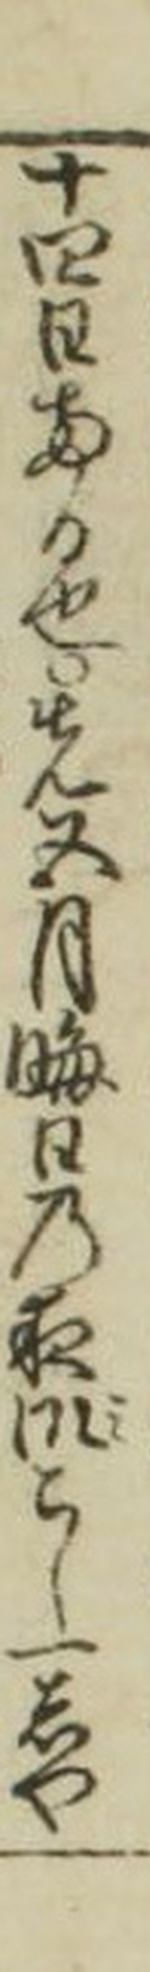十四日両日也。先五月晦日の夜御一しや
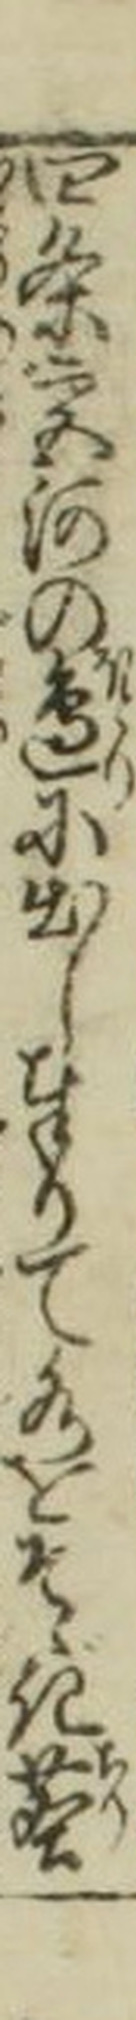四条宮河の辺に出し奉りて水をそゝぎ塵
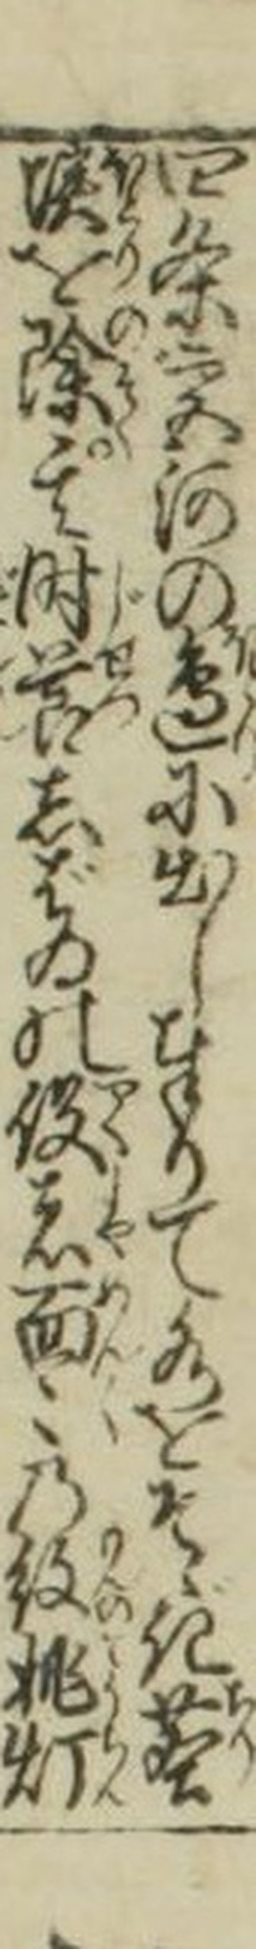埃を除。其時節しばゐの役者面〃の紋挑灯
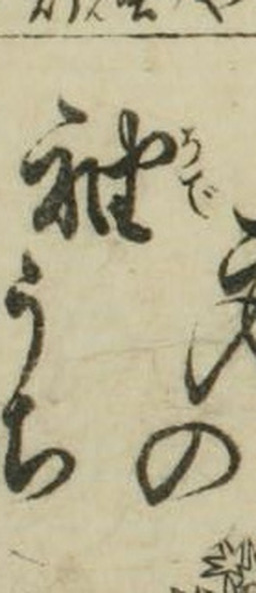袖うち
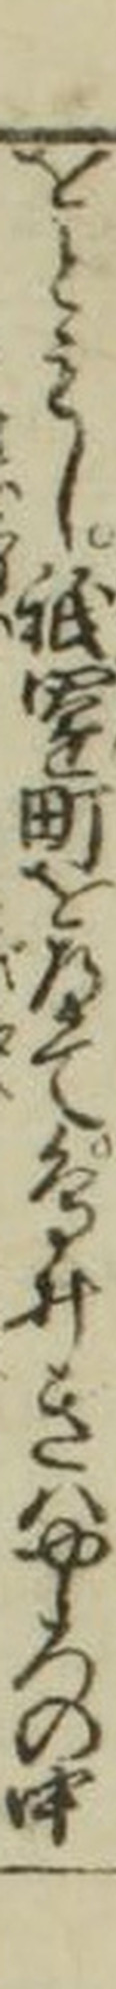をともし。祇園町をへて。鳥井ぎハやろの中
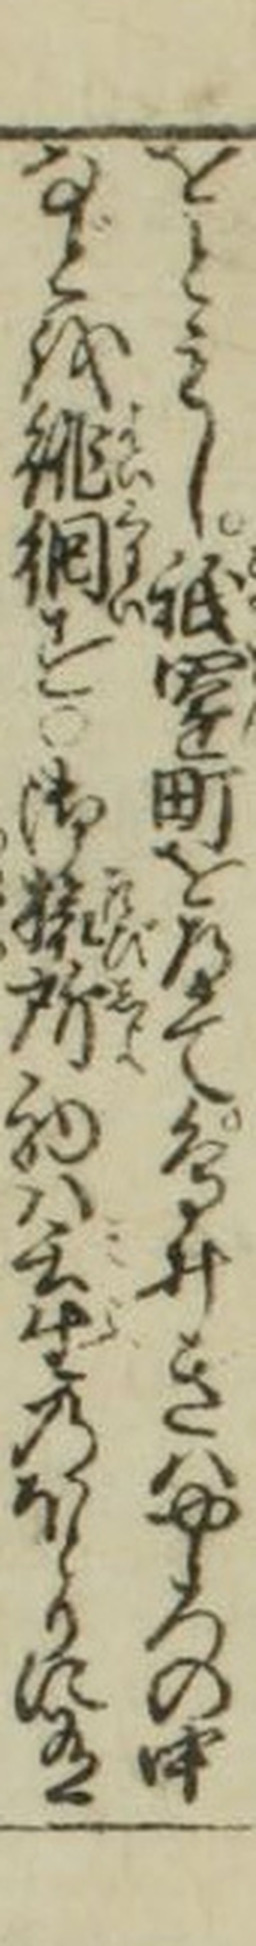を徘徊す。御旅所初ハ壬生のほとりに有
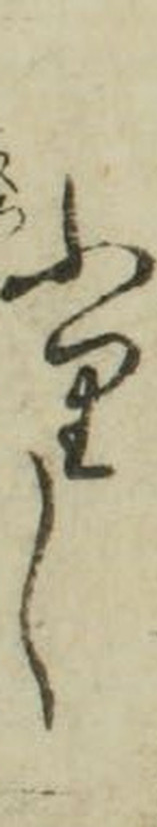ふりし
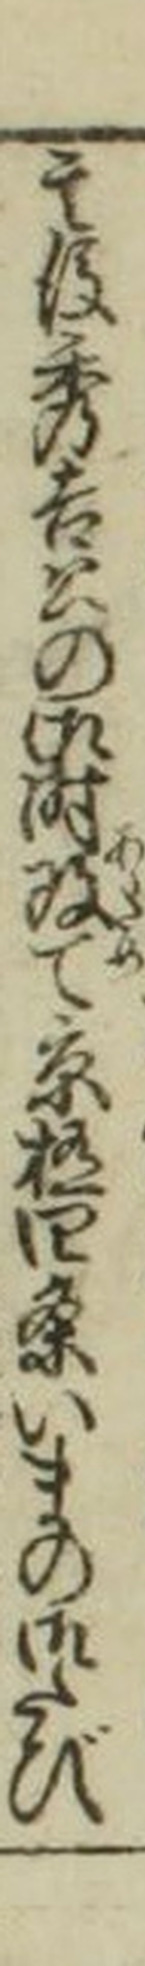其後秀吉公の御時改て京極四条いまの御たび
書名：女源氏教訓鑑
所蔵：東京学芸大学附属図書館
